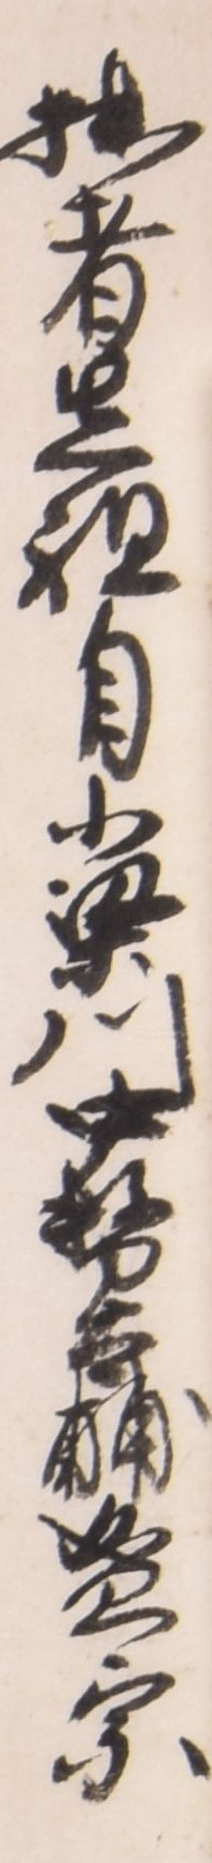拙者先祖自小梁川中務太輔盛宗
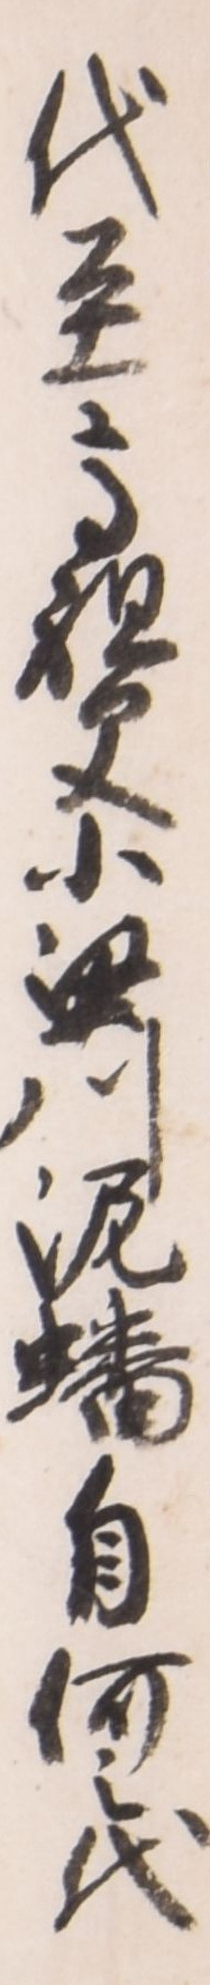代至高祖父小梁川泥蟠自何之代
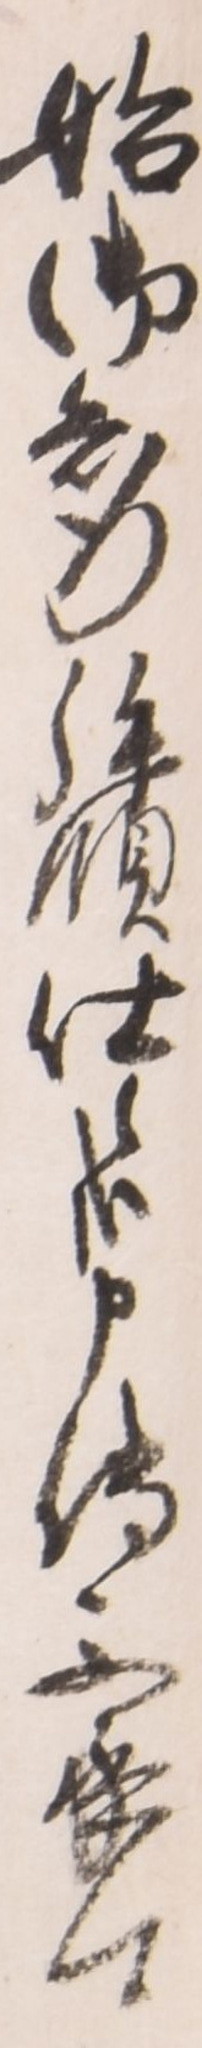始御知行拝領仕候哉申伝不承候
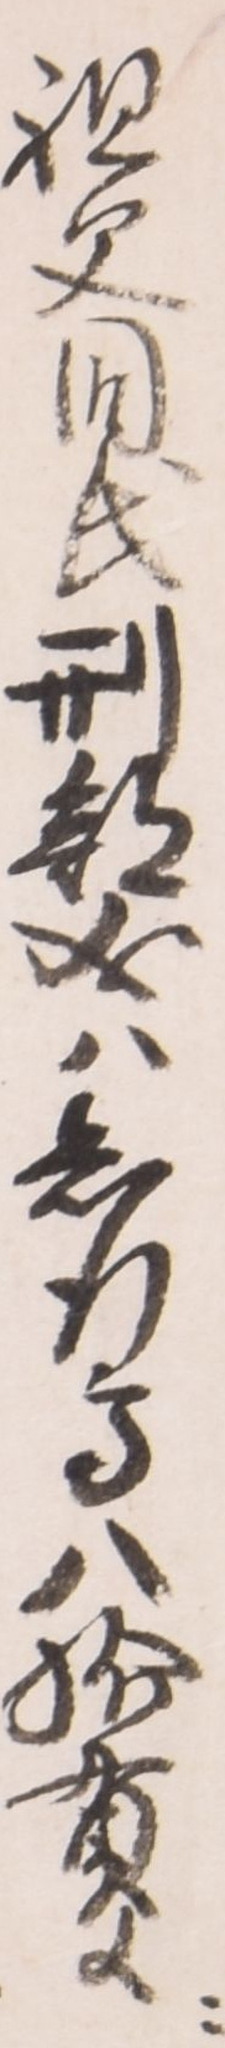祖父同氏刑部義は知行高八拾貫文に
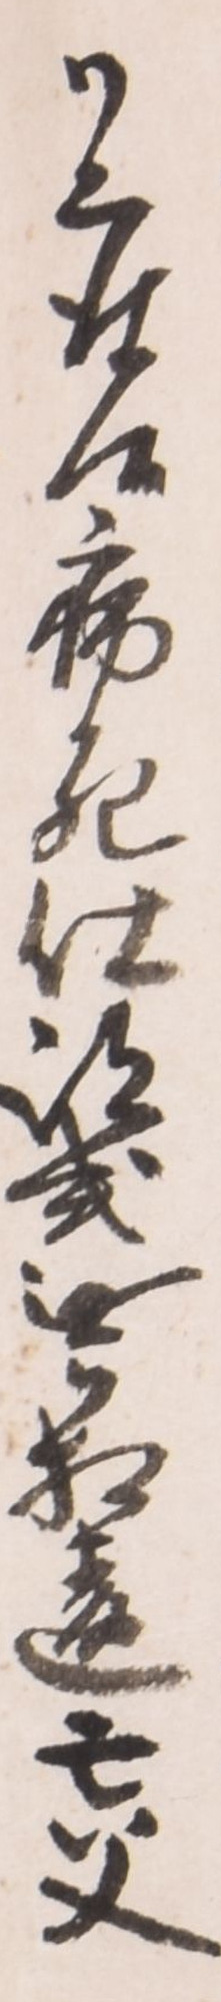御座候病死仕跡式無相違亡父
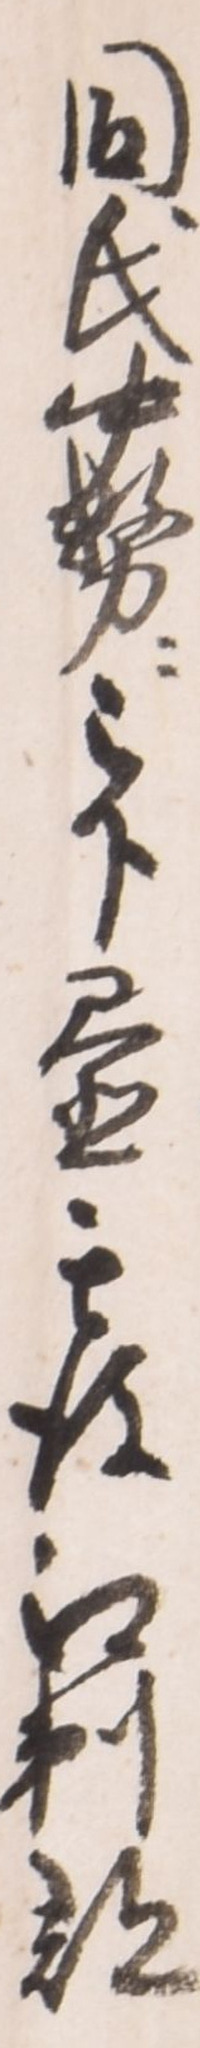同氏中務に被下置其後江刺郡
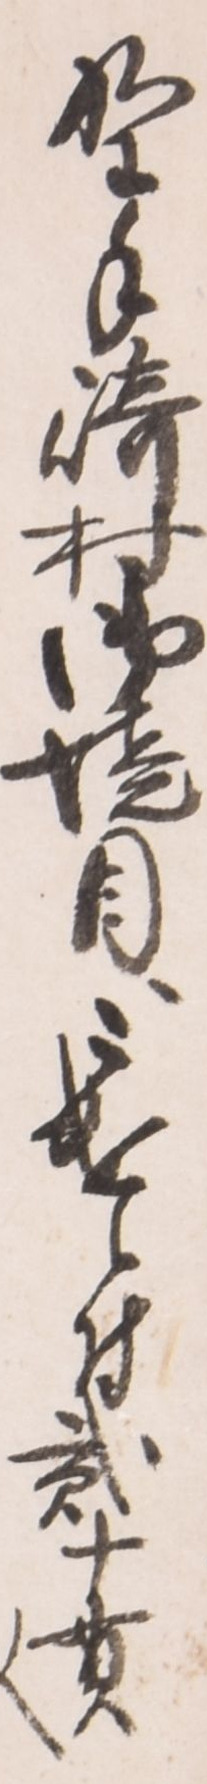野手崎村御境目へ被遣候付弐十貫文
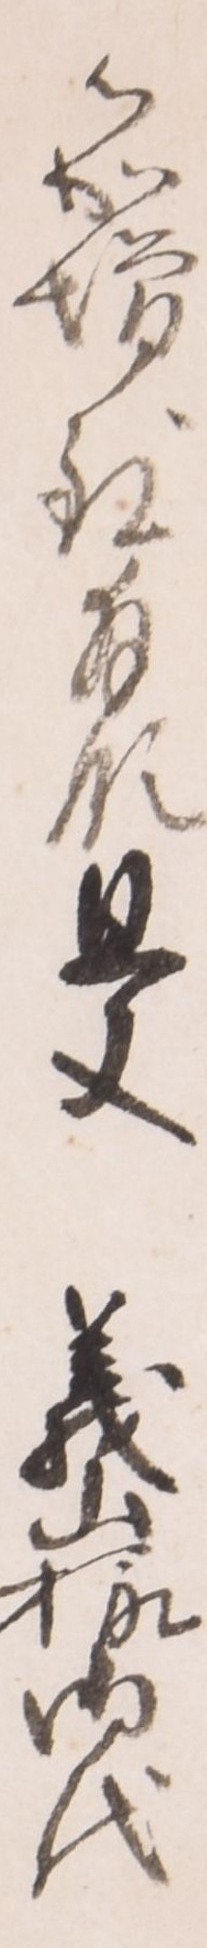御加増致拝領且又義山様御代
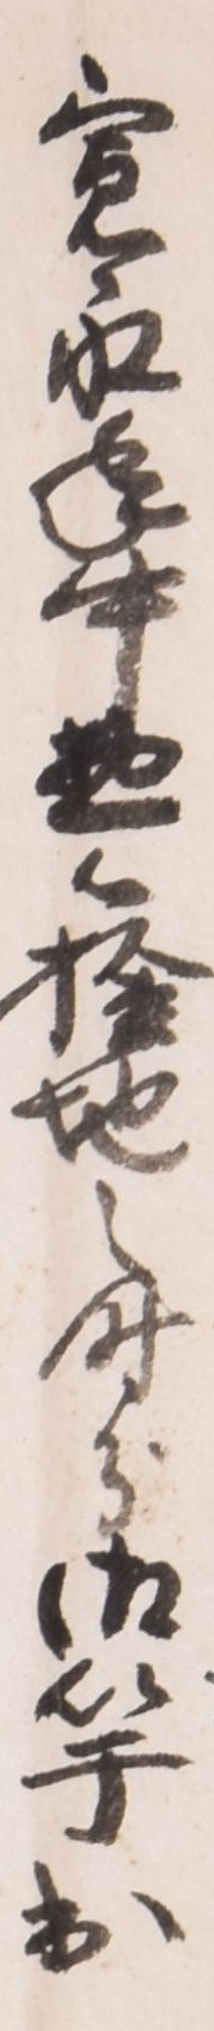寛永年中惣御検地之時分御竿出
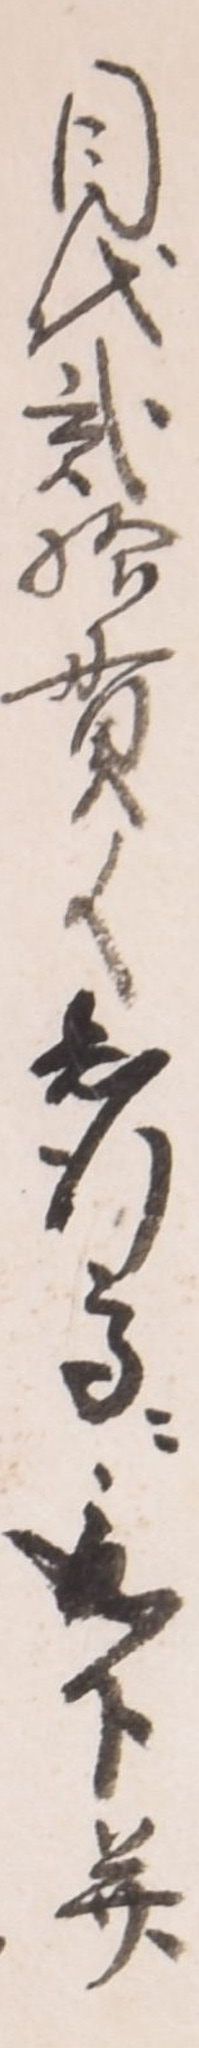目代弐拾貫文知行高に被成下並
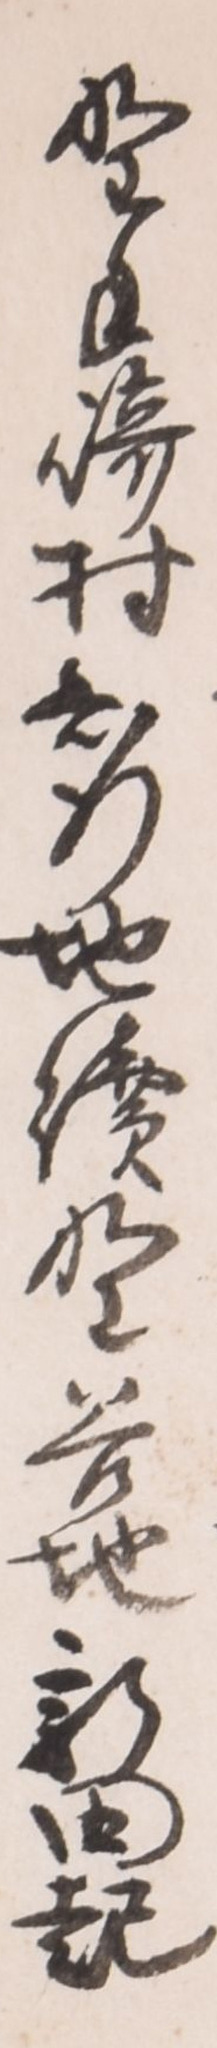野手崎村知行地続野谷地新田起
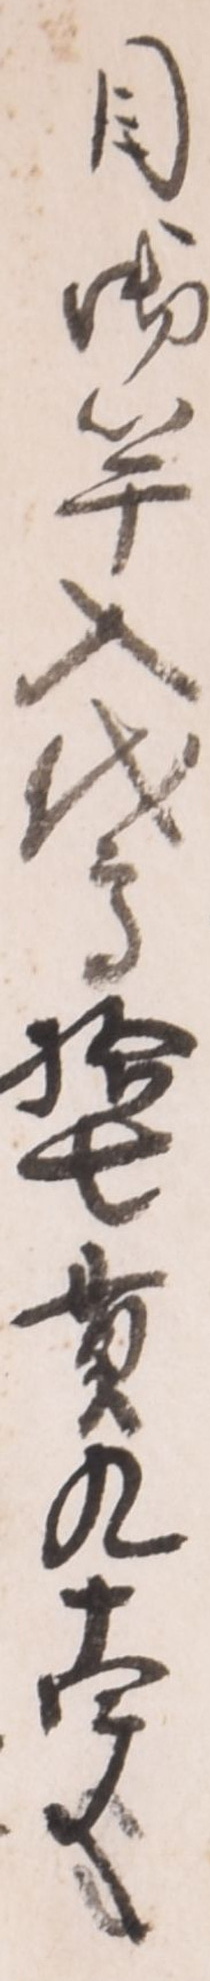目へ御竿入代高拾七貫九十四文
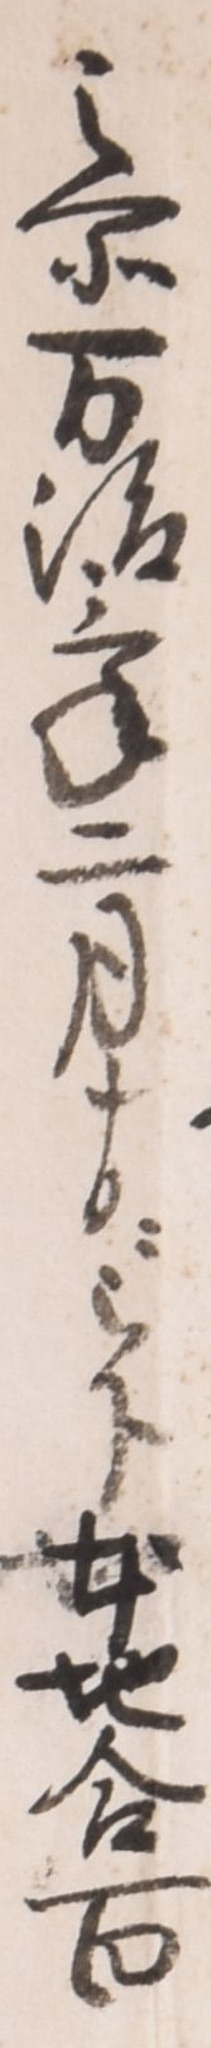之所万治三年二月十日に被下本地合百
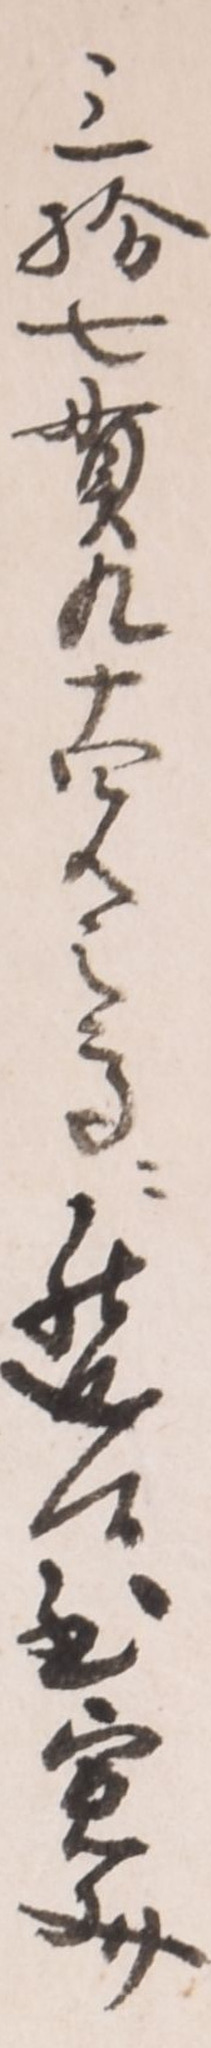三拾七貫九十四文之高に罷成候至寛文
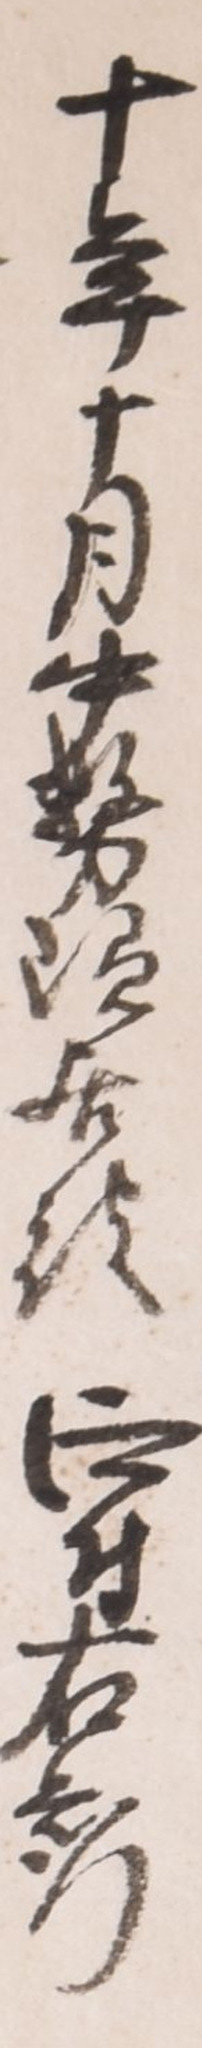十年十月中務隠居被仰付右知行
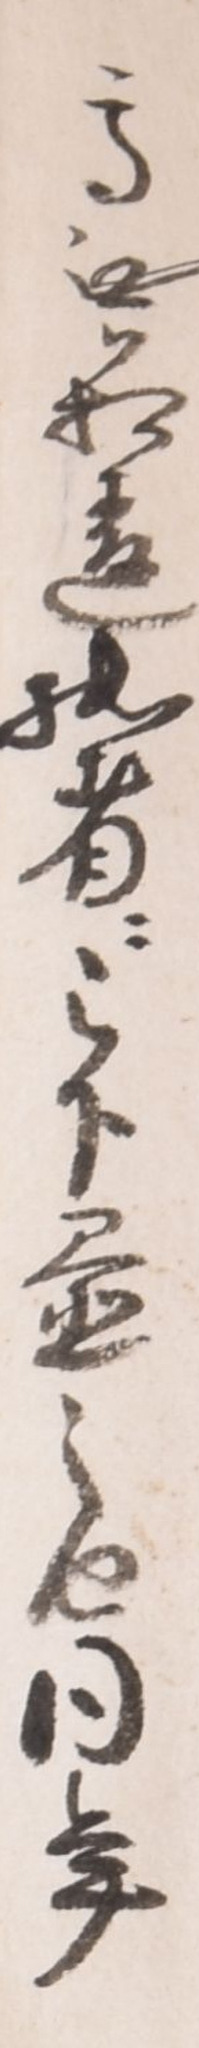高無御相違拙者に被下置之由同年
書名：「拙者先祖自小梁川中務太輔盛宗〜」
